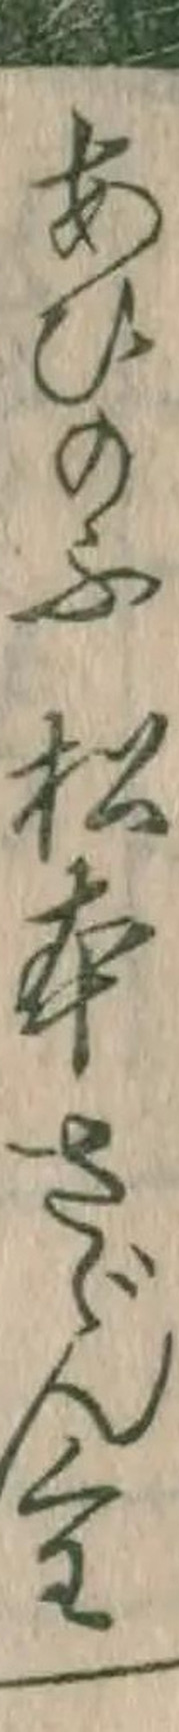あひのふ松本さゞんくわ
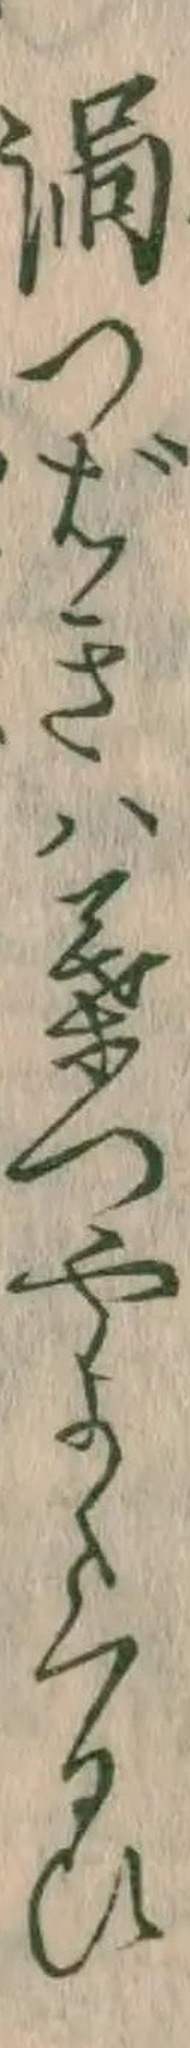渦つばきは葉つやよくくるひ
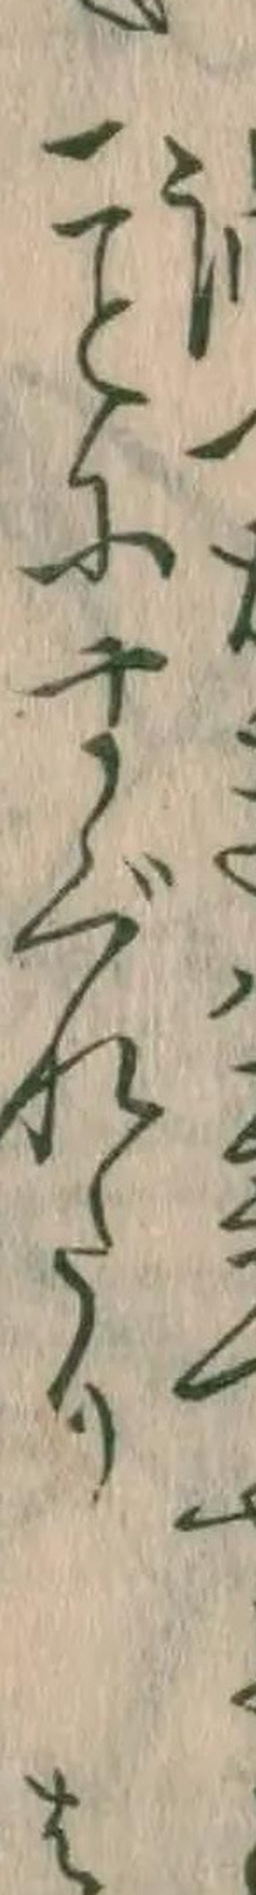ことにすぐれたり
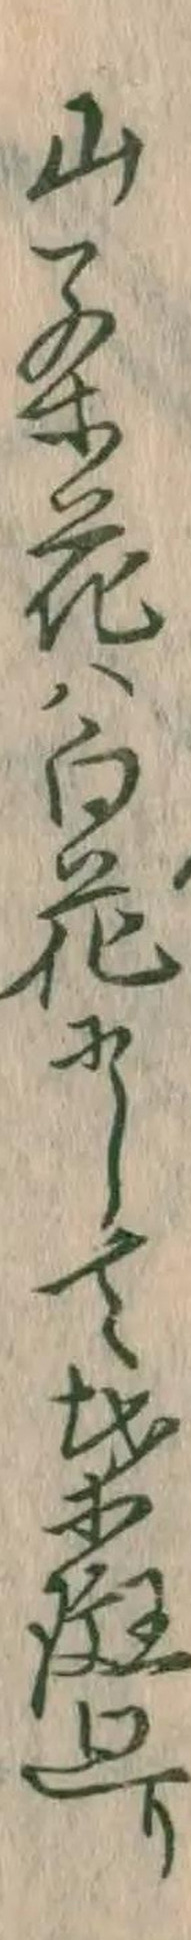山茶花は白花にして葉斑廻り
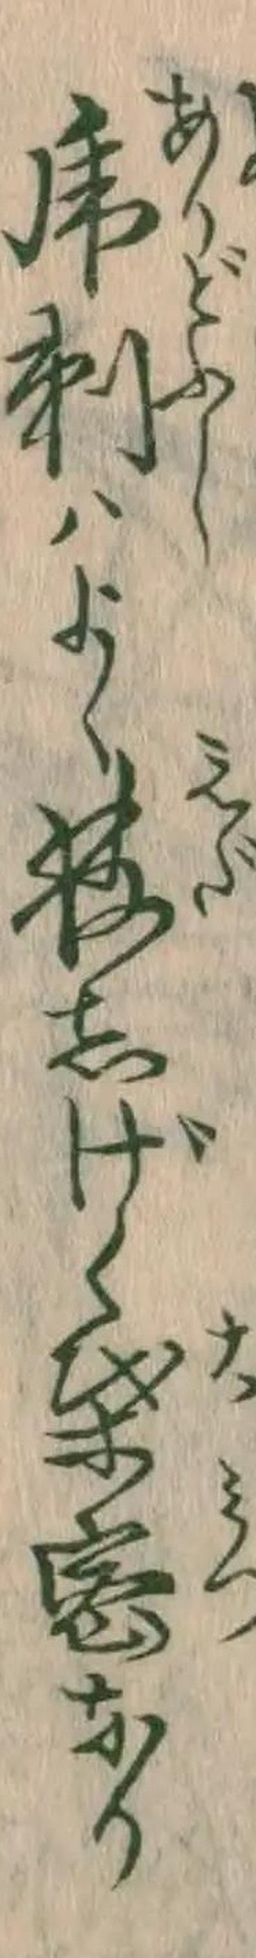乕刺はよく枝しげく葉密なり
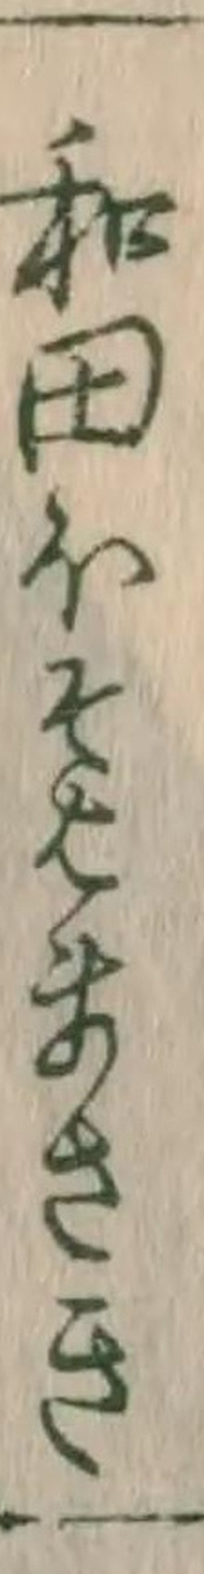和田ほそはまさき
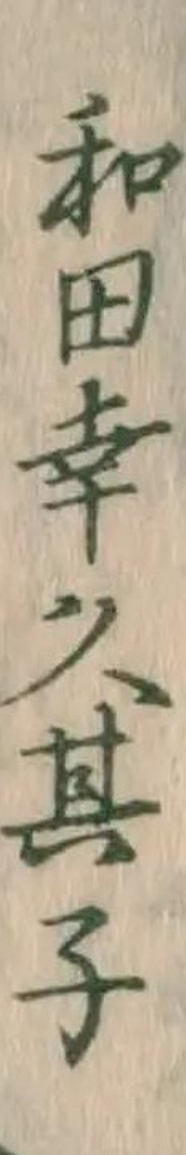和田幸久其子
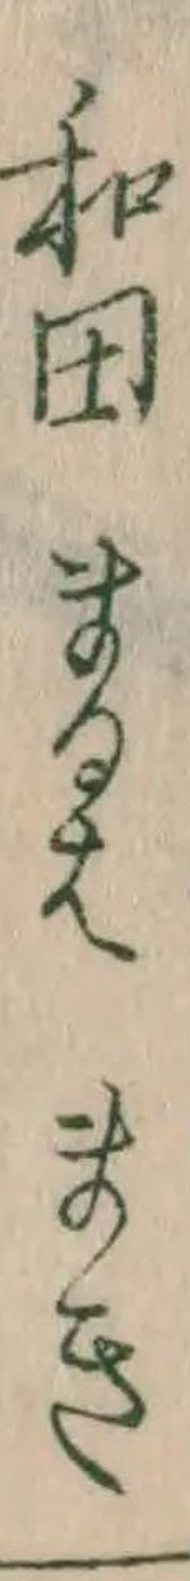和田まるはまき
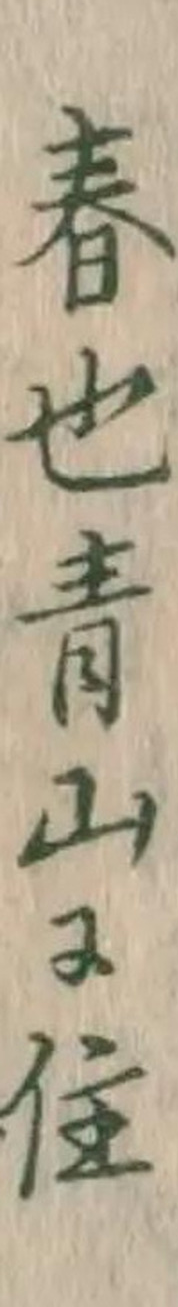春也青山に住
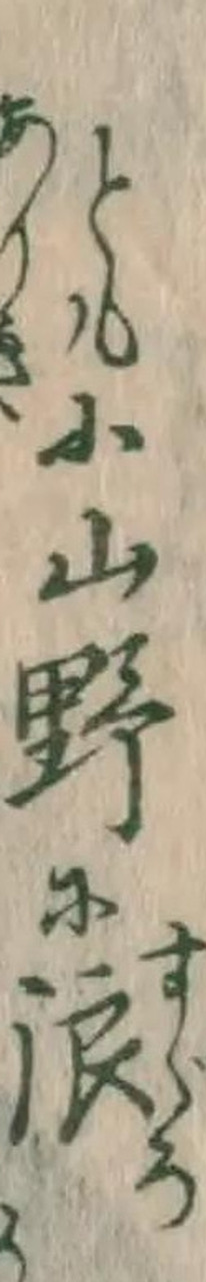ともに山野に浪
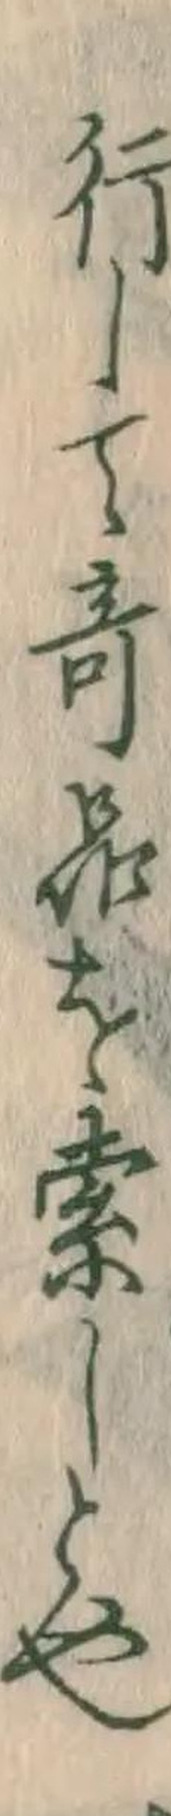行して奇品を索しとや
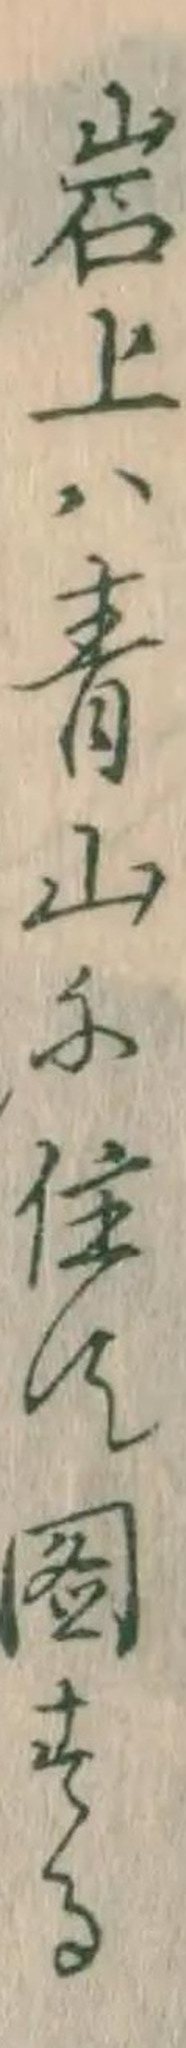岩上は青山に住す図する
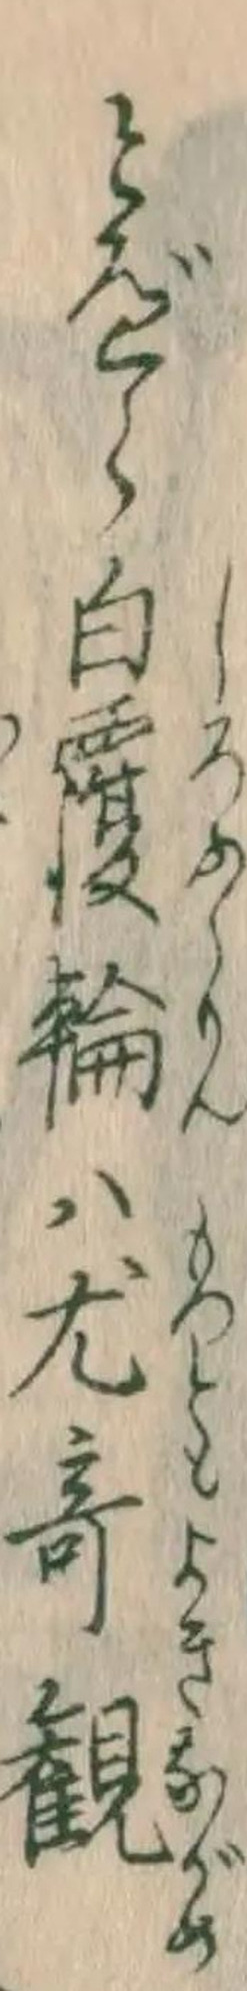とべら白覆輪は尤奇観
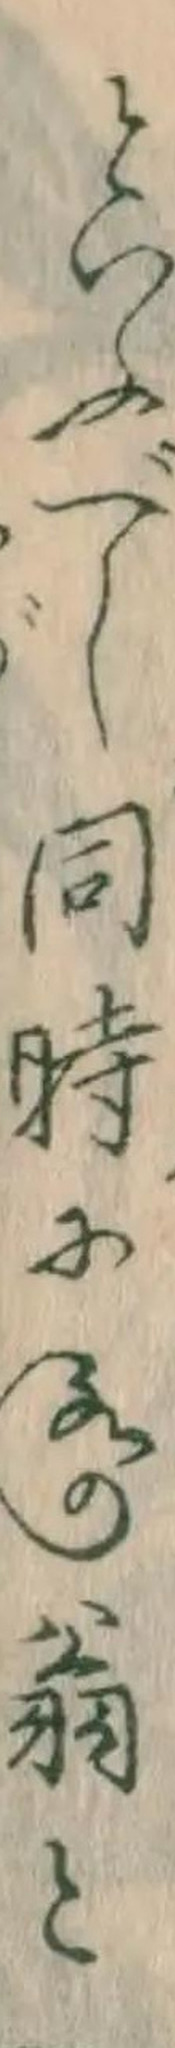といふべし同時に水の翁と
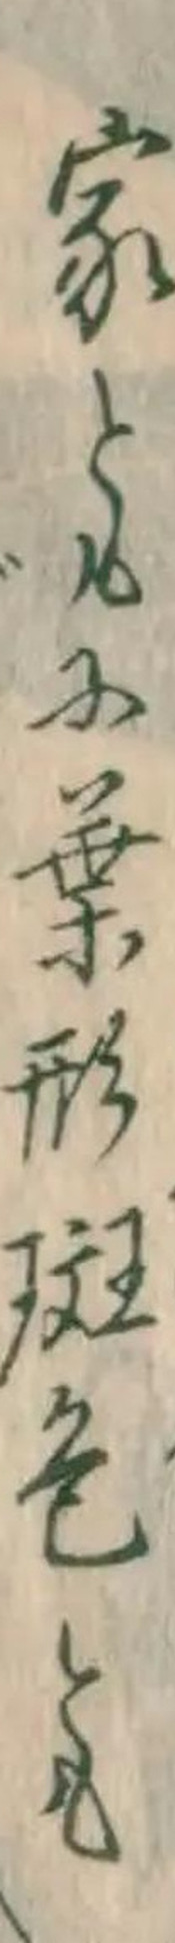家ともに葉形斑色とも
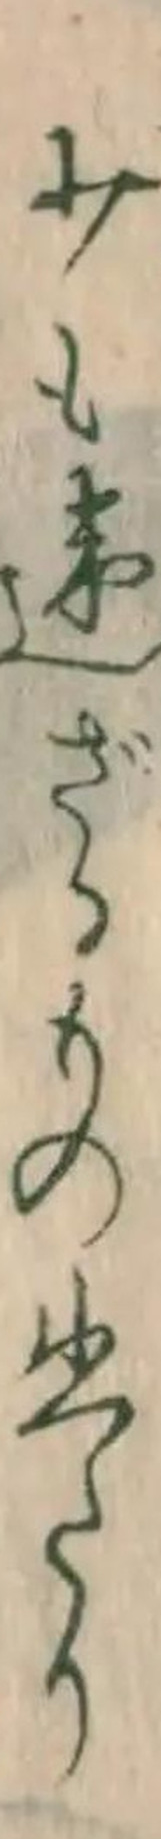少も違ざるもの出たり
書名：草木奇品家雅見 3巻. [2]
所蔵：国立国会図書館 National Diet Library, JAPAN
